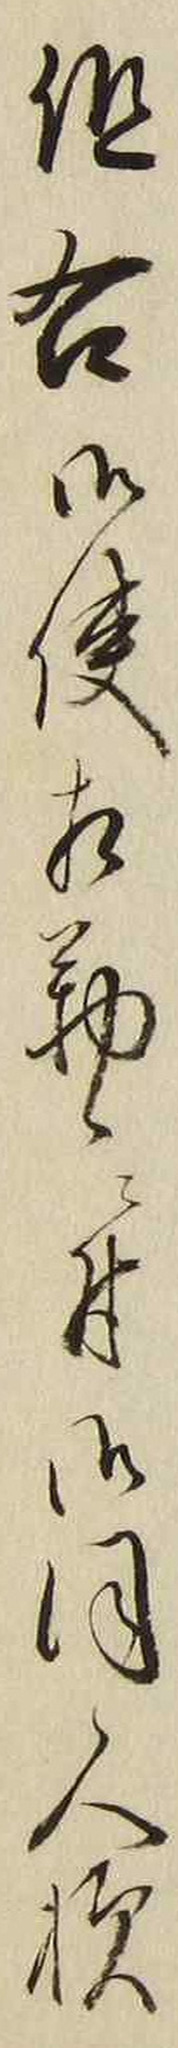但右御使相勤候ニ付御同人様

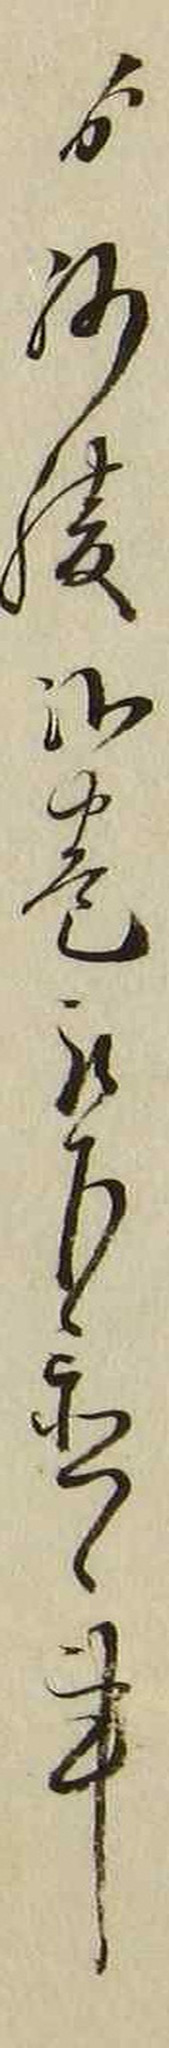ゟ紗綾弐巻被下置候事
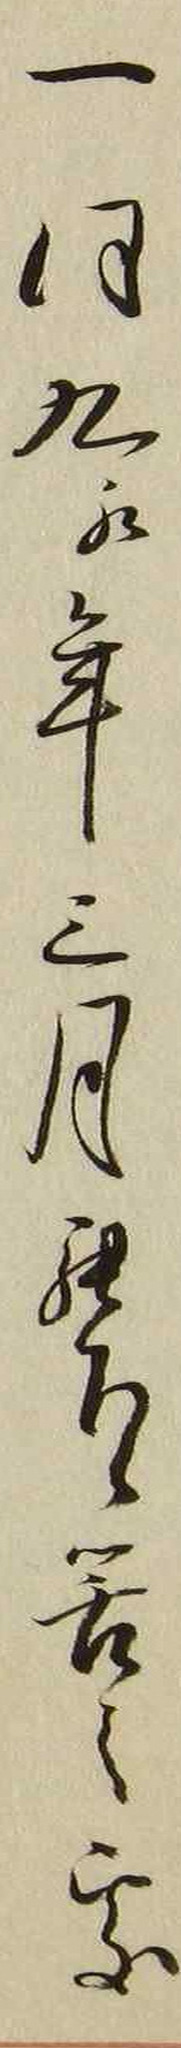一同九卯年三月罷下候筈之処
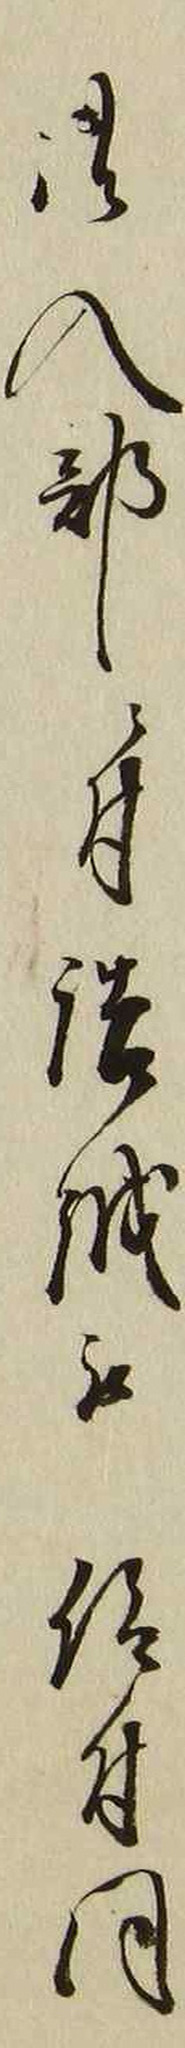御入部ニ付詰越被仰付同
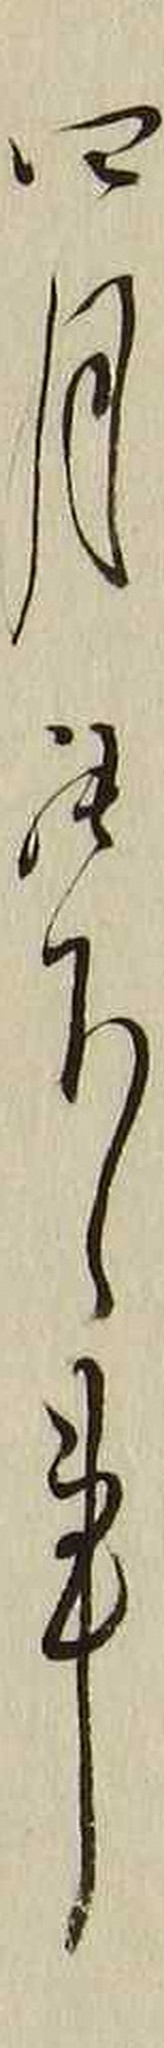四月罷下候事
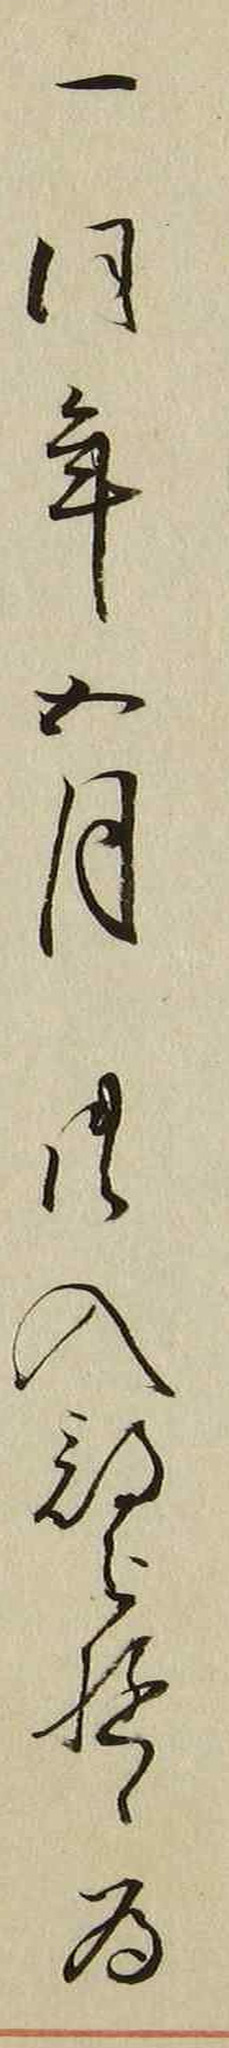一同年五月御入部被遊候為
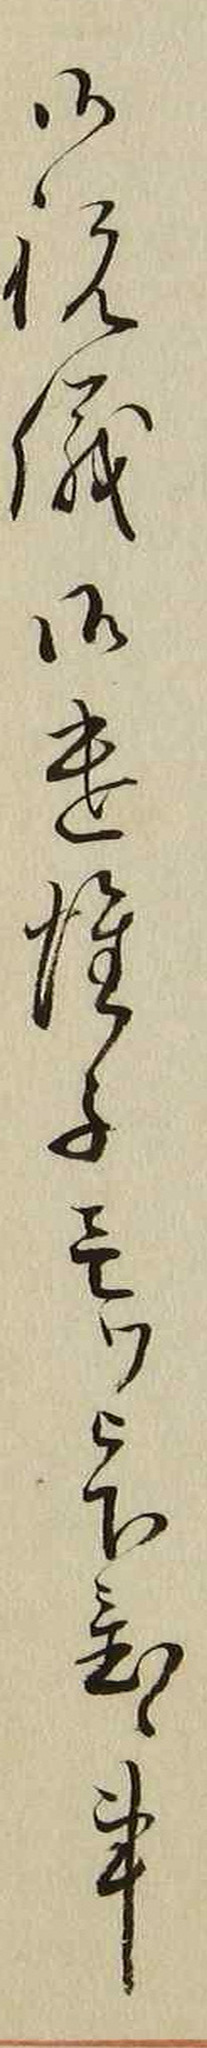御祝儀御遣帷子壱ツ被下置候事
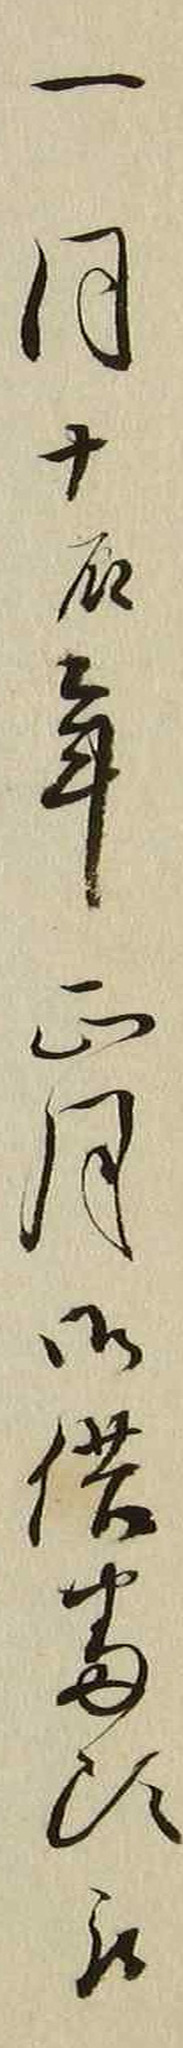一同十辰年正月御供番頭被
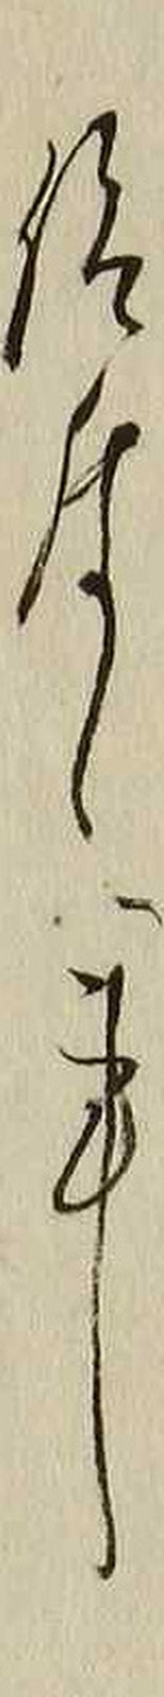仰付候事
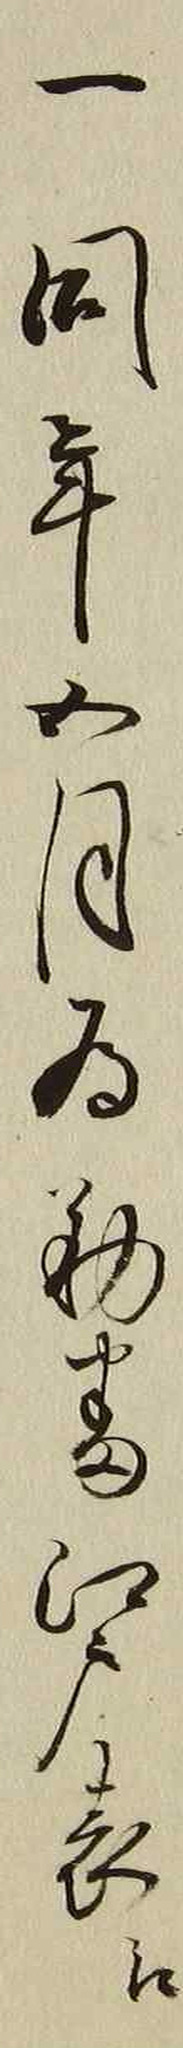一同年五月為勤番江戸表江
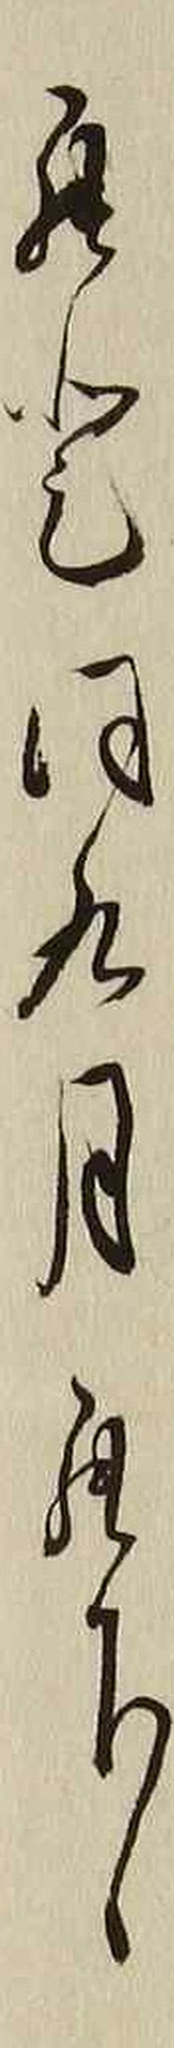罷登同九月罷下候
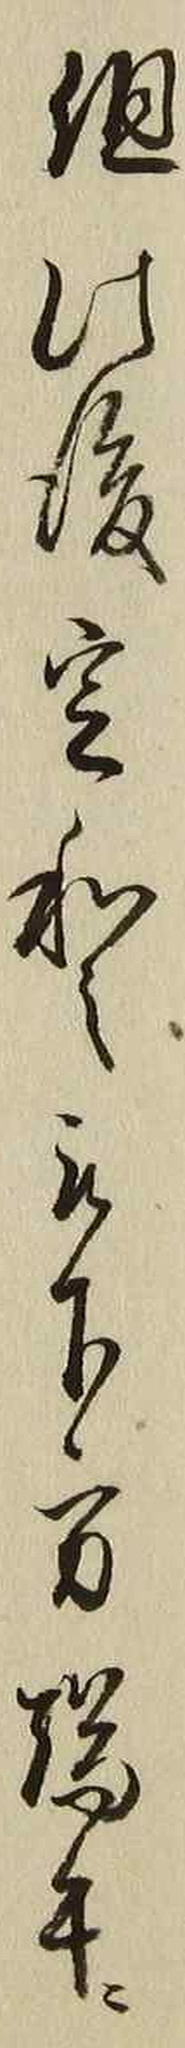但此後定和之被下方端午ニ
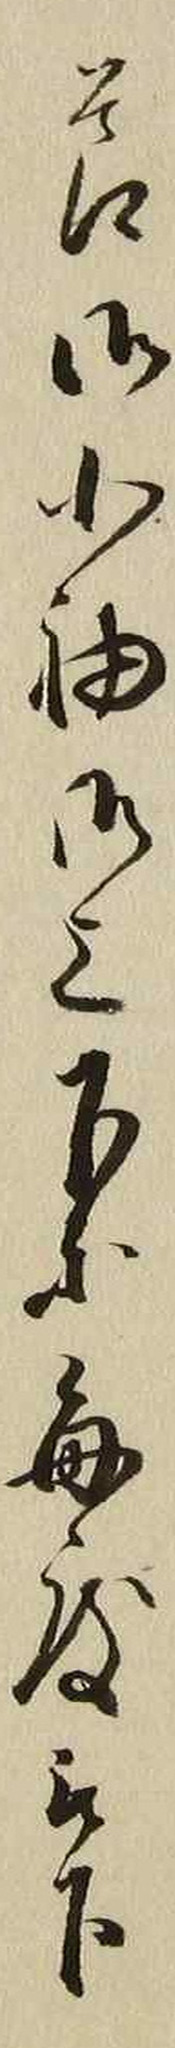節御小袖御上下に毎度被下
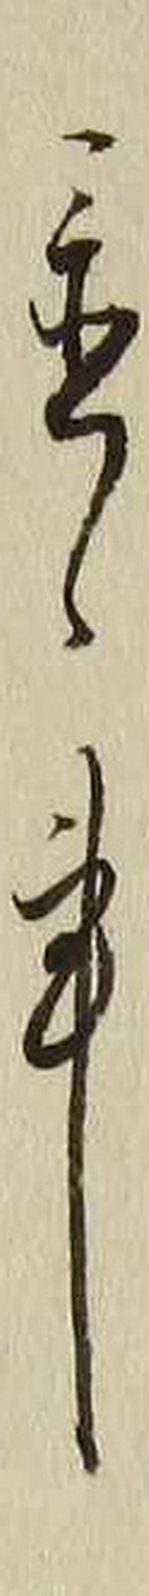置候事
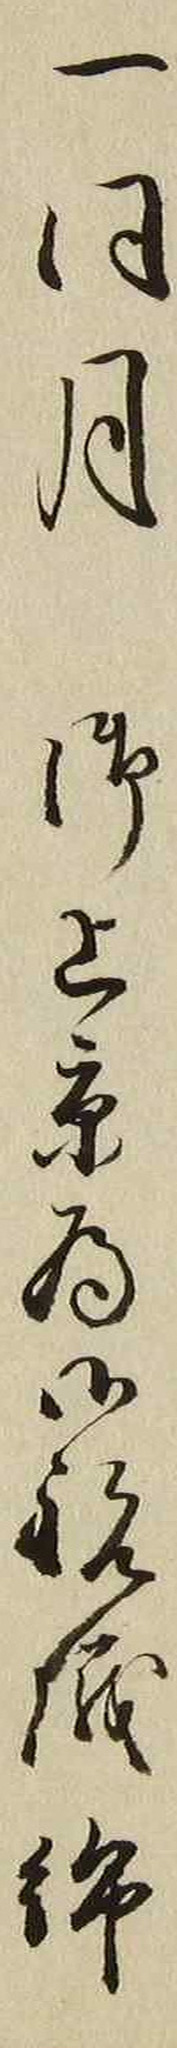一同月御上京為御祝儀綿
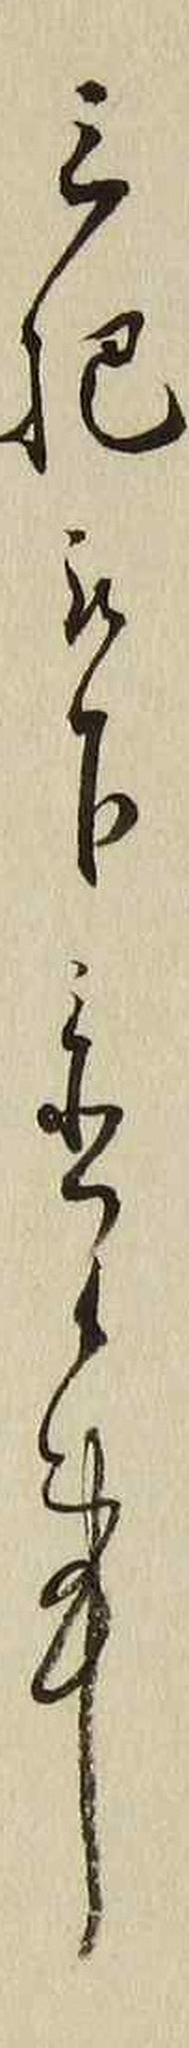三肥被下置候事
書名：諸士系譜　巻之1　い之部1
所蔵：会津若松市立会津図書館
